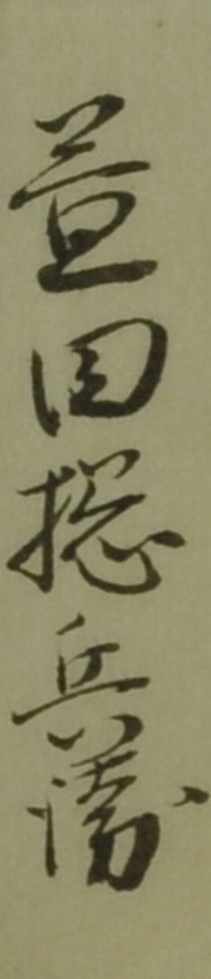益田総兵衛
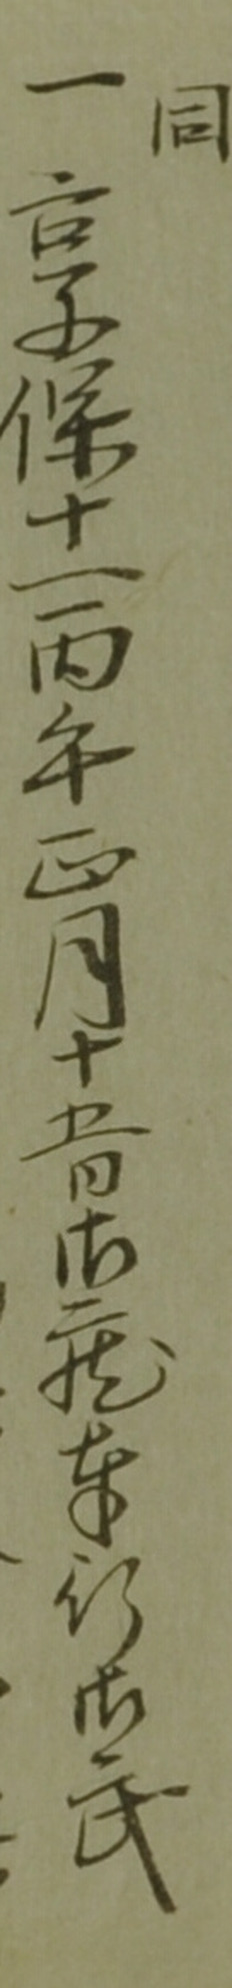一享保十一丙午正月十五日御蔵奉行御武
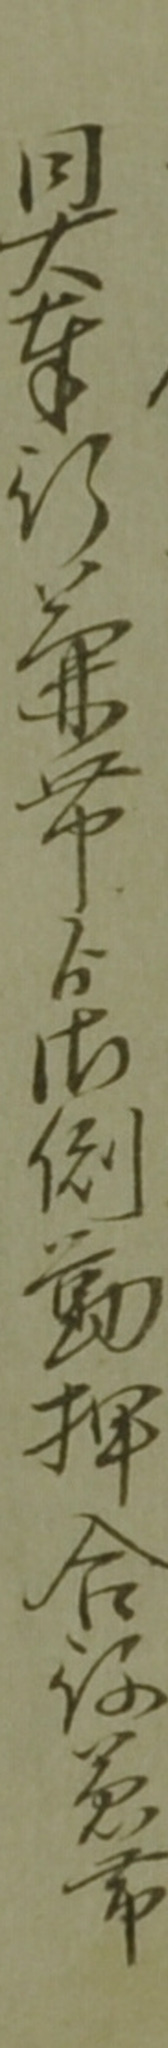具奉行兼帯ゟ御側勤押合役兼帯
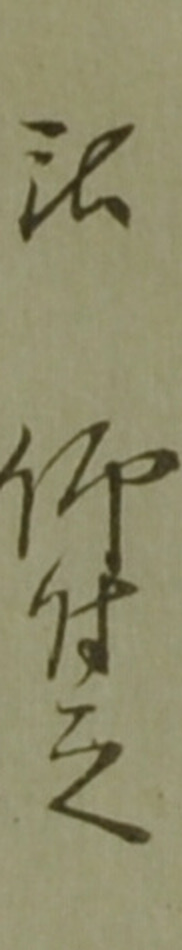被仰付之
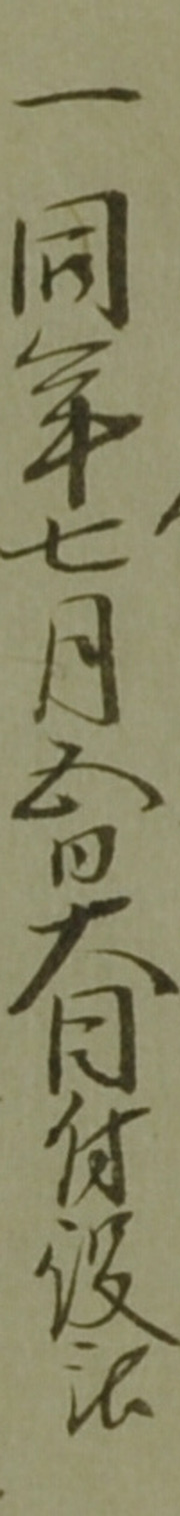一同年七月五日大目付役被
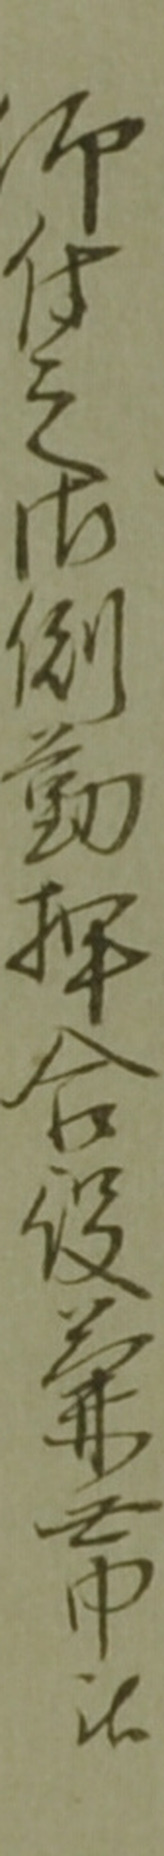仰付之御側勤押合役兼帯被
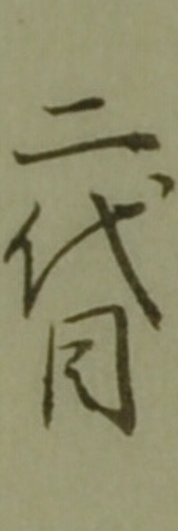二代目
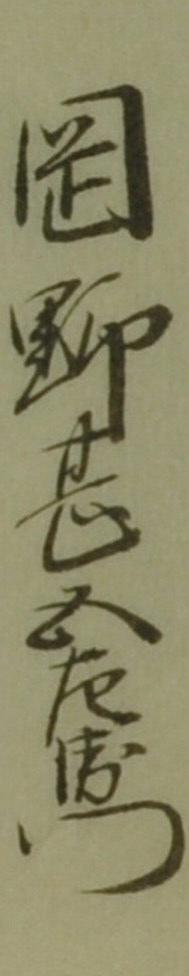岡野甚五左衛門
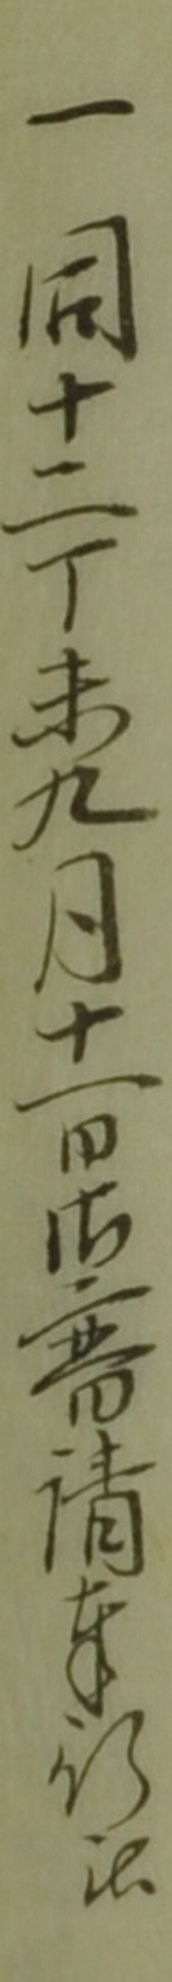一同十二丁未九月十一日御普請奉行被
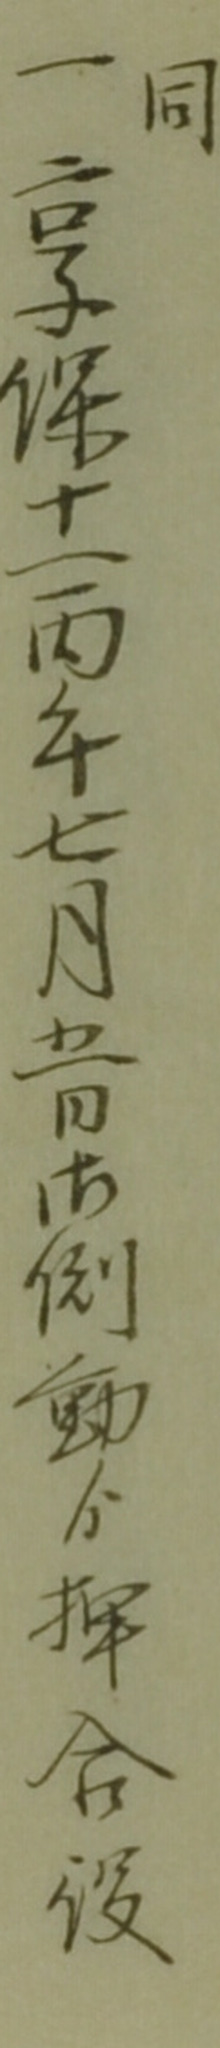一享保十一丙午七月五日御側勤ゟ押合役
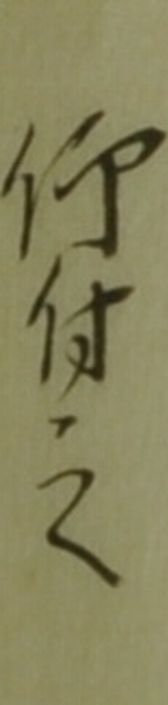仰付之
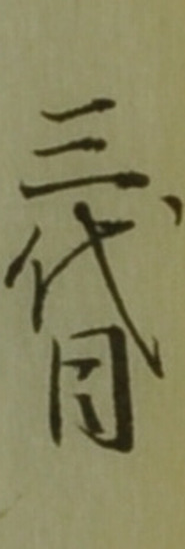三代目
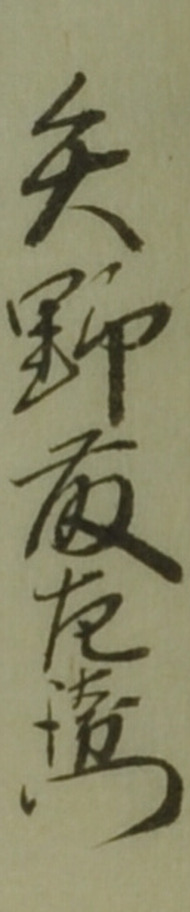矢野籐左衛門
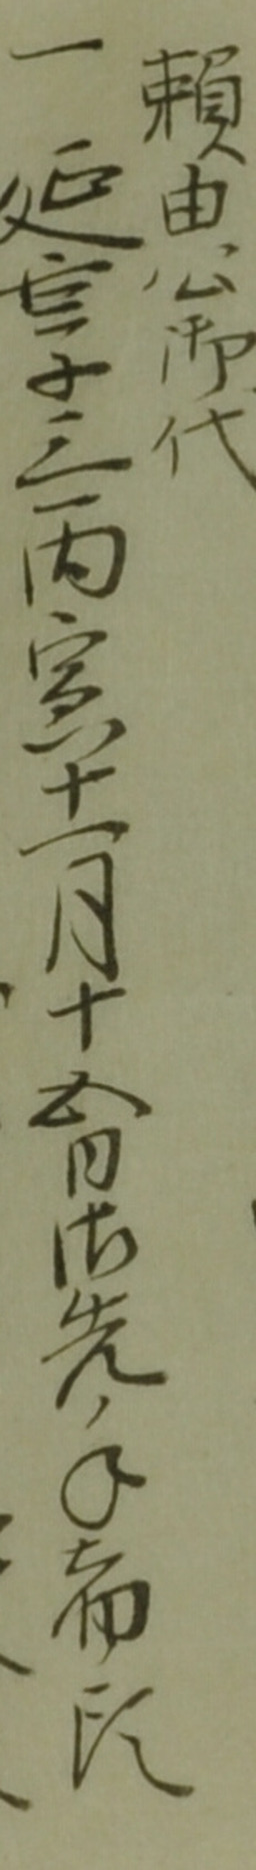一延享三丙寅十一月十五日御先手者頭
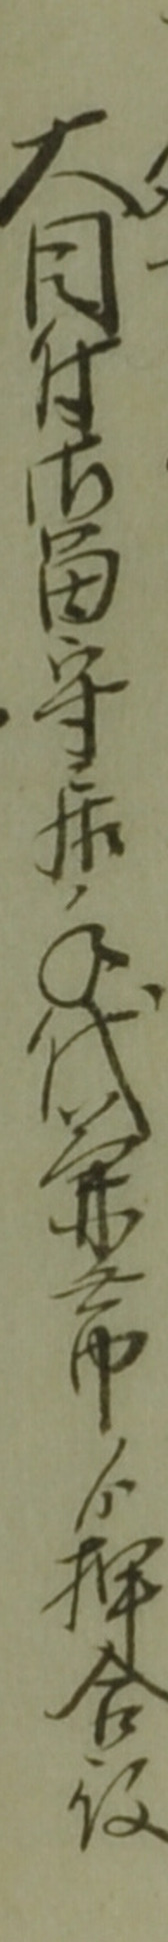大目付御留守居手代兼帯ゟ押合役
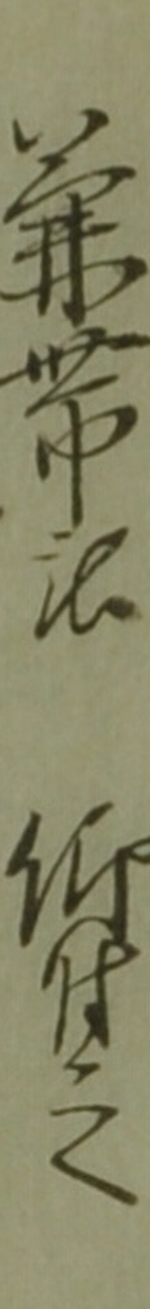兼帯被仰付之
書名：諸御役代々録（七）
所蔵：伊那市立高遠町図書館・合同会社AMANE
